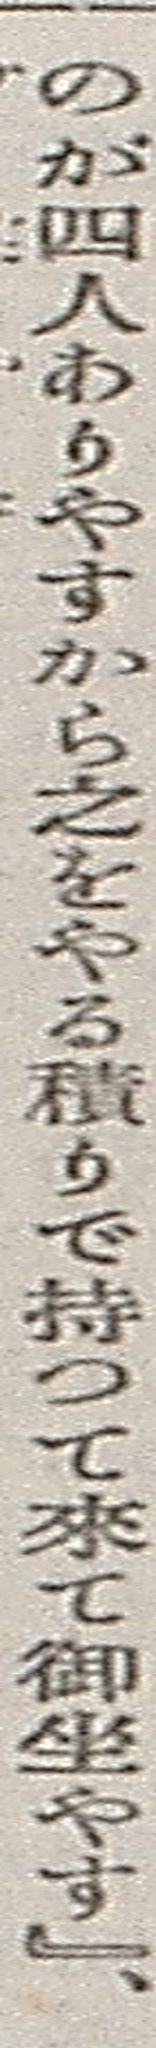のが四人ありやすから之をやる積りで持つて来て御坐やす』、
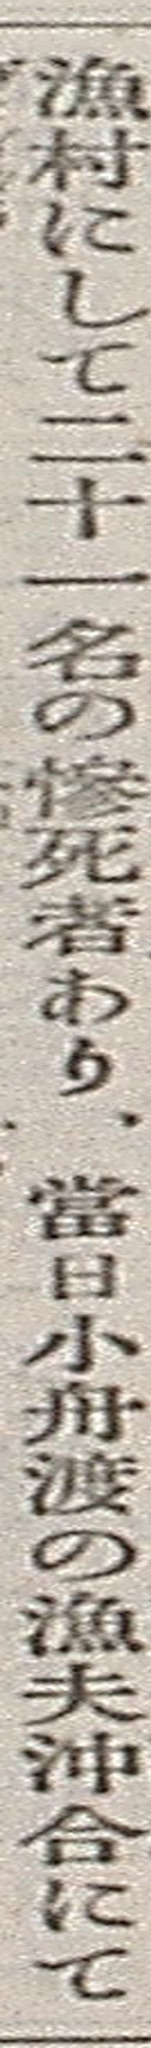漁村にして二十一名の惨死者あり、当日小舟渡の漁夫沖合にて
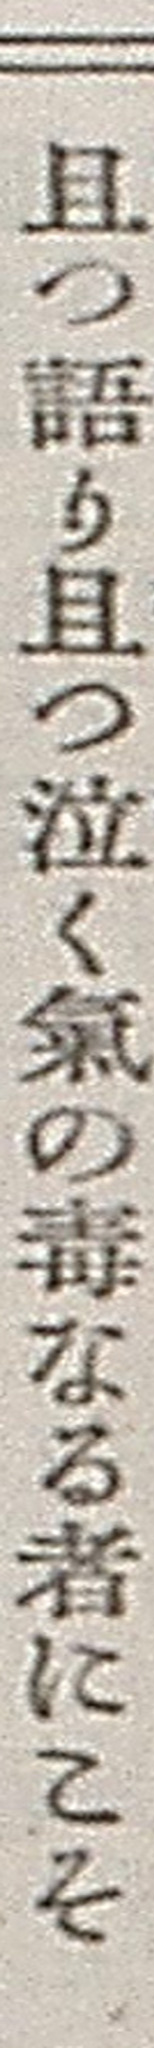且つ語り且つ泣く気の毒なる者にこそ
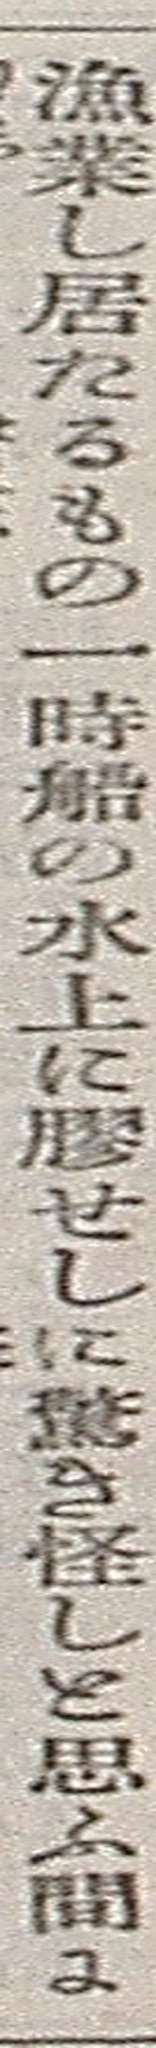漁業し居たるもの一時船の水上に膠せしに驚き怪しと思ふ間に
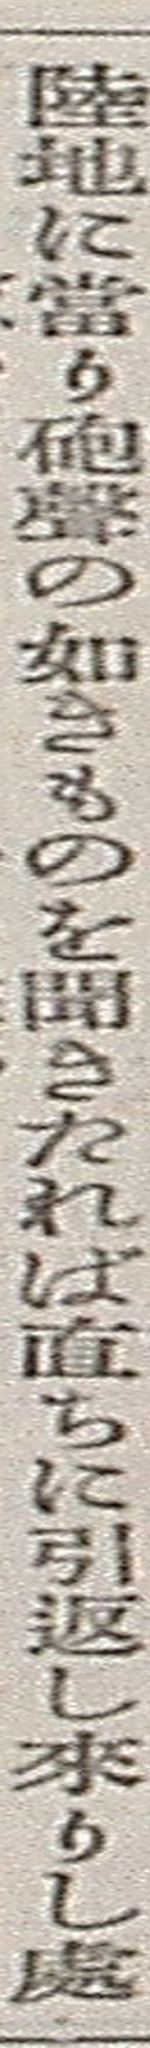陸地に当り砲声の如きものを聞きたれば直ちに引返し来りし処
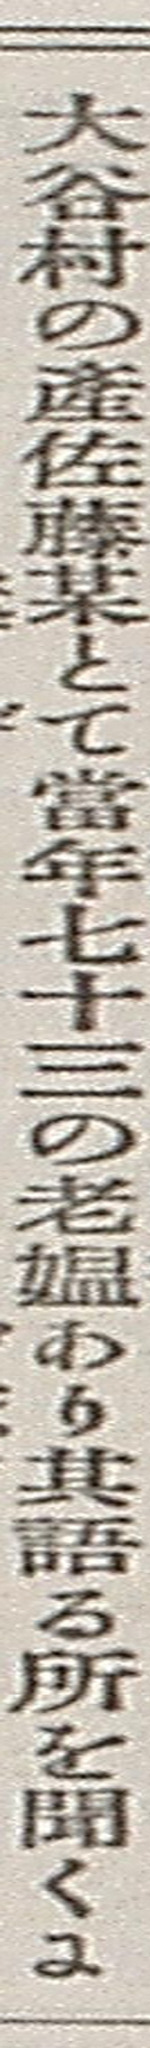大谷村の産佐藤某とて当年七十三の老媼あり其語る所を聞くに
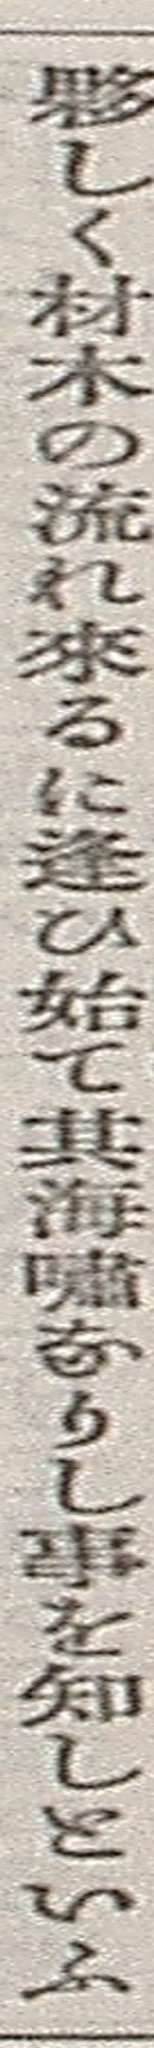夥しく材木の流れ来るに逢ひ始て其海嘯なりし事を知しといふ
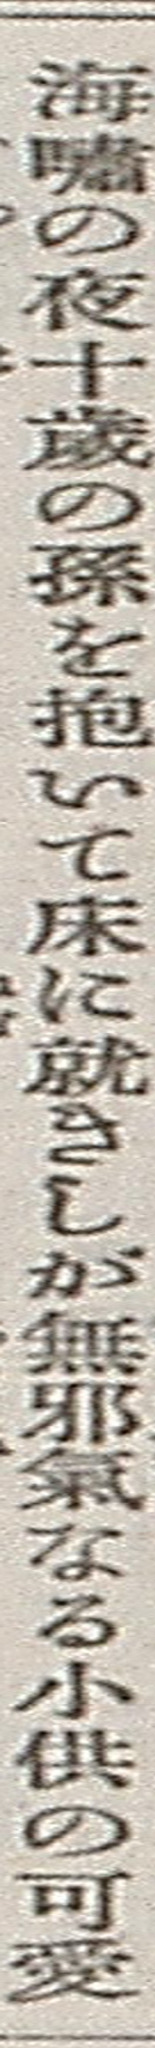海嘯の夜十歳の孫を抱いて床に就きしが無邪気なる小供の可愛
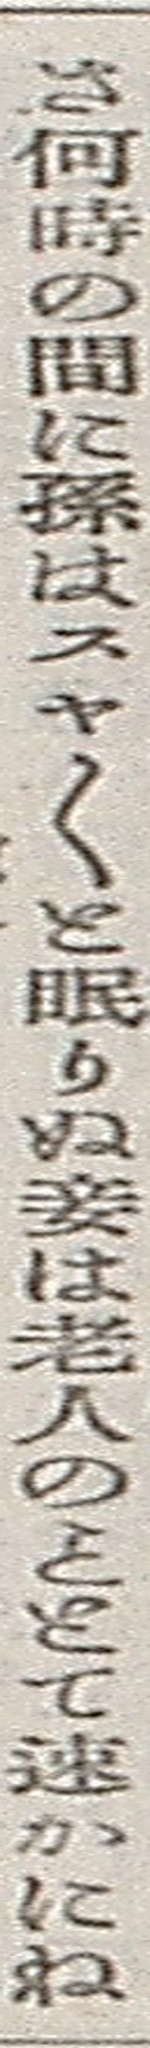さ何時の間に孫はスヤ〳〵と眠りぬ妾は老人のこととて速かにね
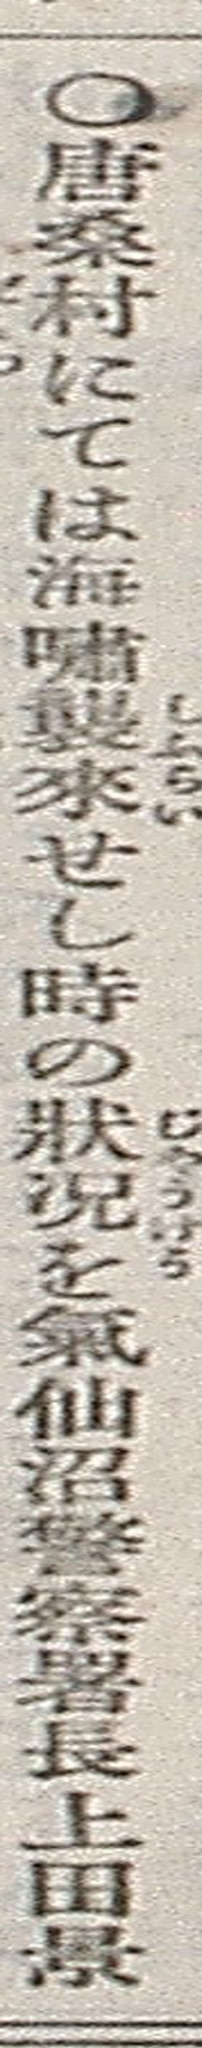○唐桑村にては海嘯襲来せし時の状况を気仙沼警察署長上田景
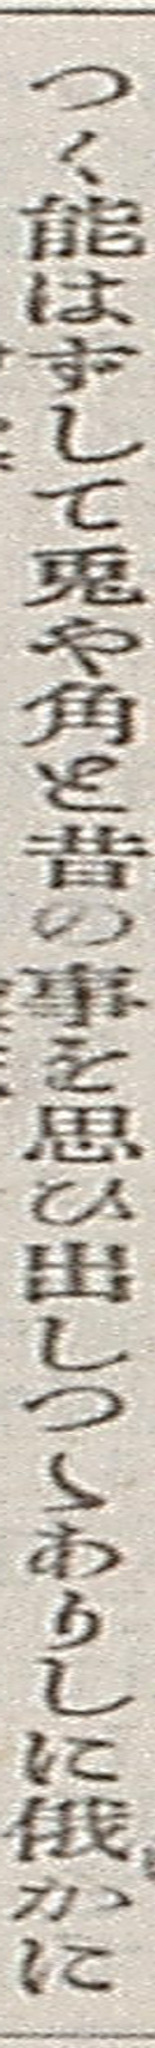つく能はずして兎や角と昔の事を思ひ出しつゝありしに俄かに
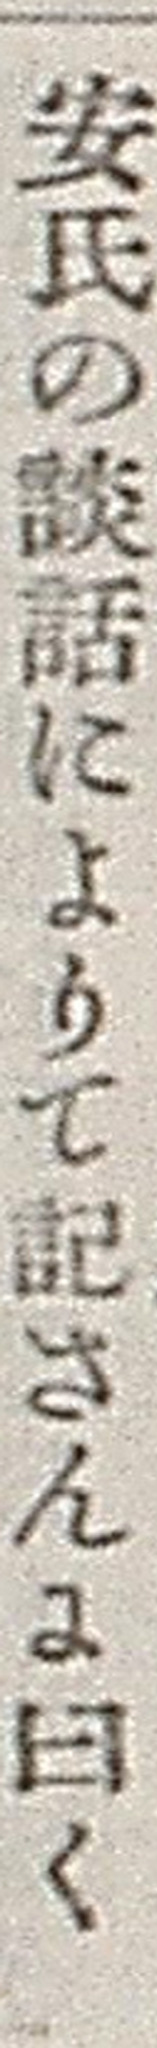安氏の談話によりて記さんに曰く
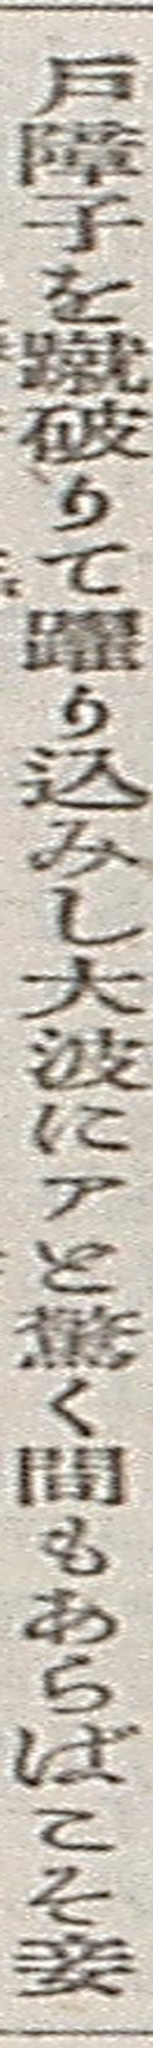戸障子を蹴破りて躍り込みし大波にアと驚く間もあらばこそ妾
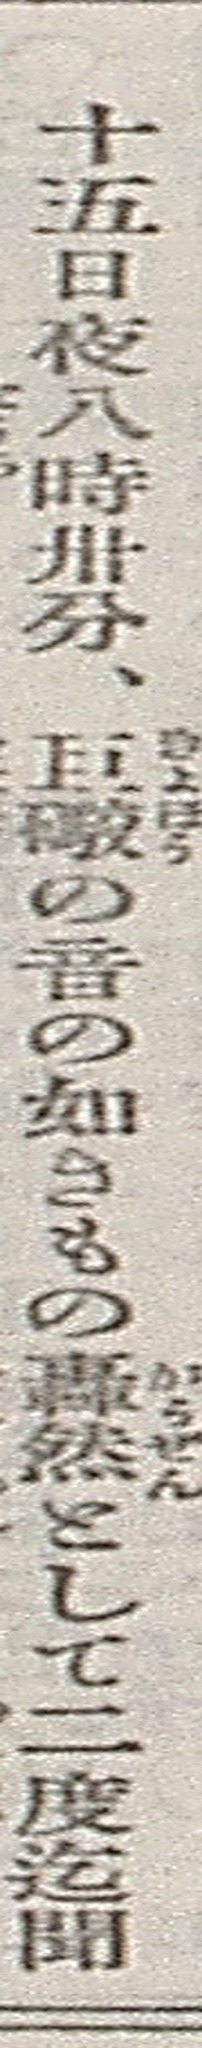十五日夜八時卅分、巨礟の音の如きもの轟然として二度迄聞
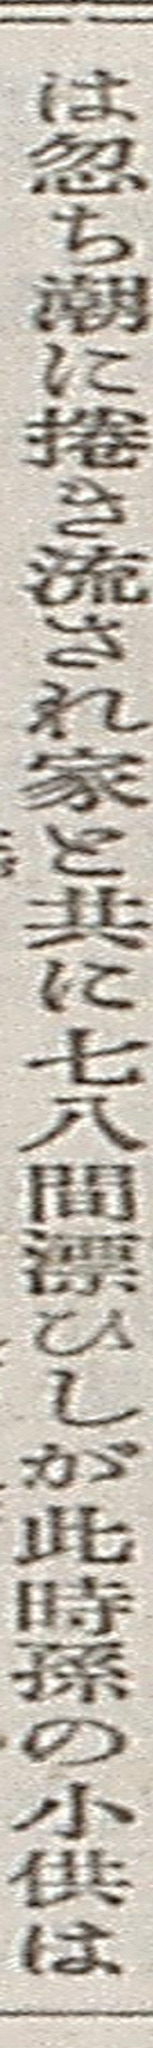は忽ち潮に捲き流され家と共に七八間漂ひしが此時孫の小供は
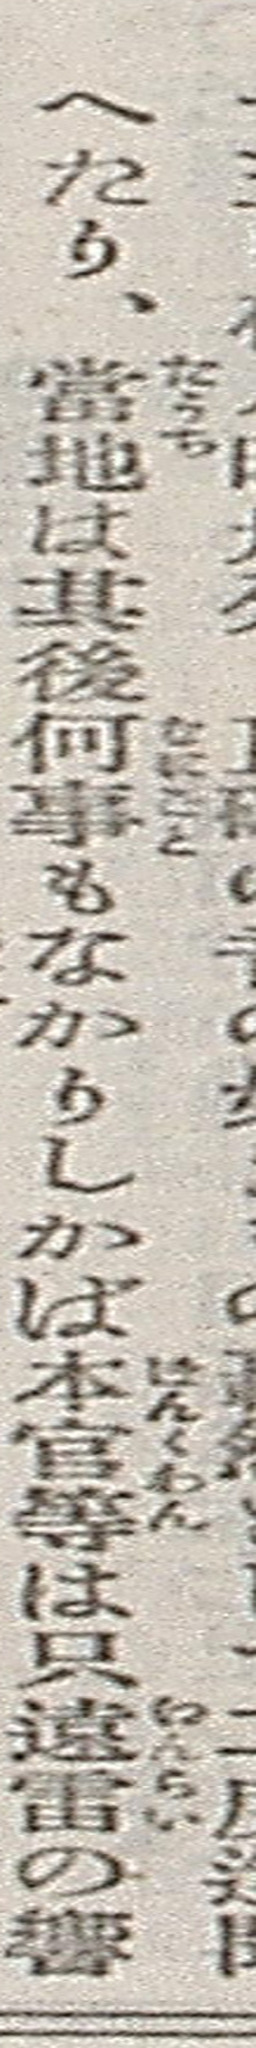へたり、当地は其後何事もなかりしかば本官等は只遠雷の響
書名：風俗畫報臨時増刊第百十九號　大海嘯被害録（中）
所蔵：東京大学地震研究所図書室 Earthquake Research Institute Library, The University of Tokyo, JAPAN
